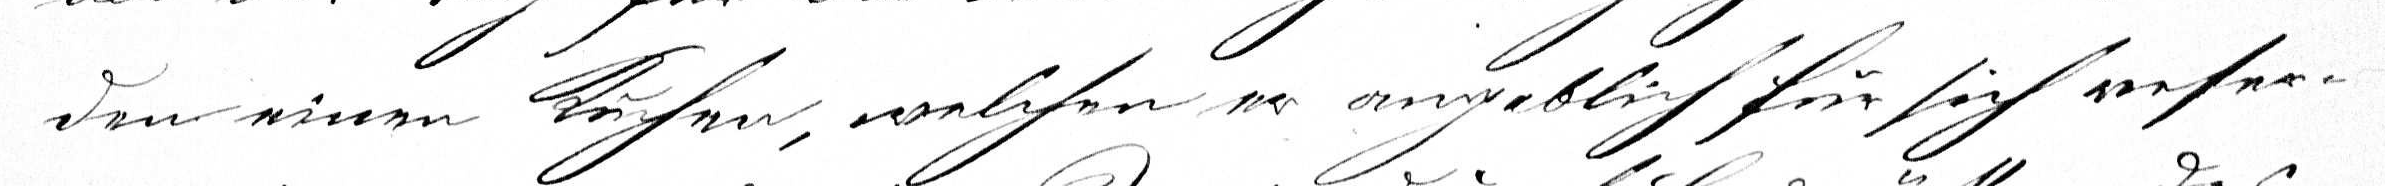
den einen Kuchen, welchen er angeblich für sich reser¬
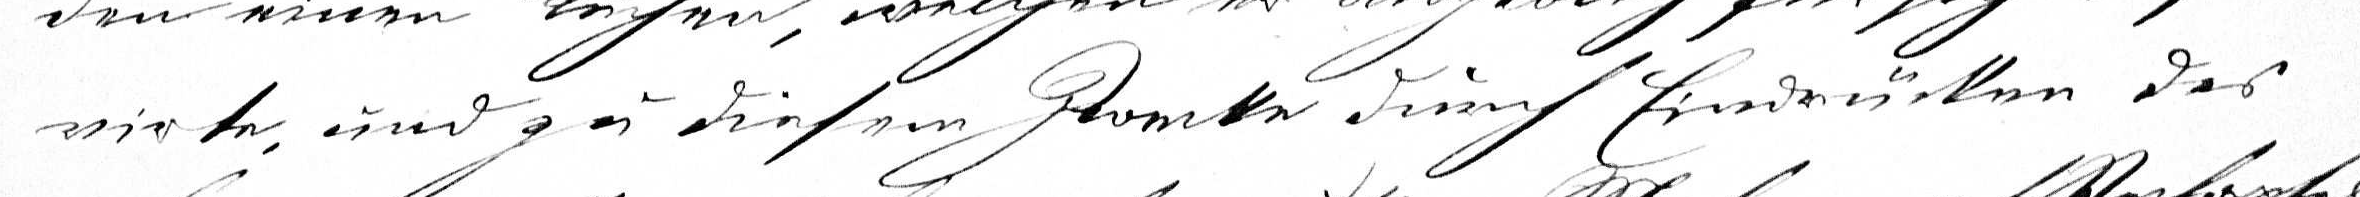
virte, und zu diesem Zwecke durch Eindrücken des
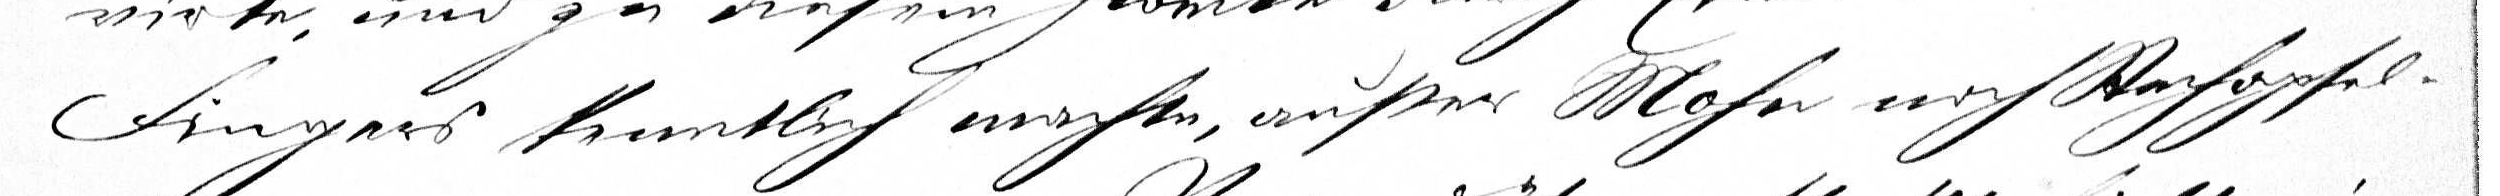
Fingers kenntlich machte, außer Mohn noch xx¬
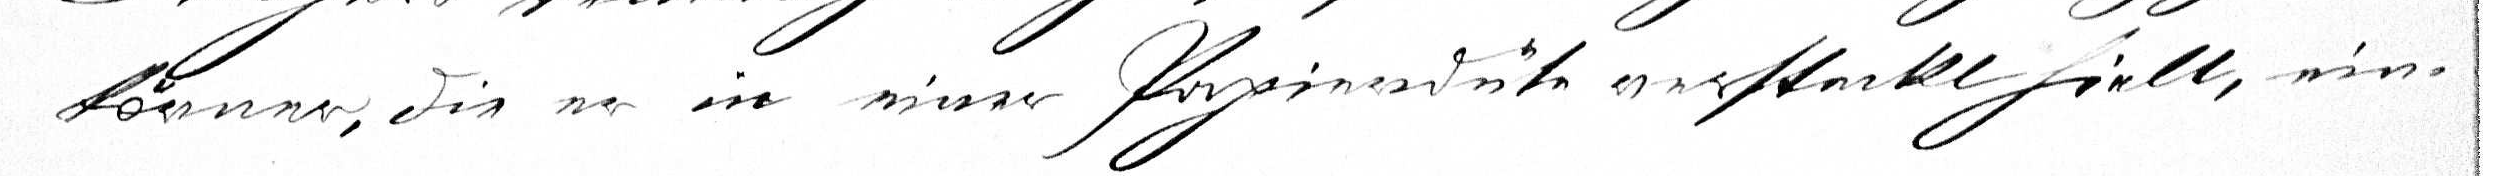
körner, die er in einer Papierxx versteckt hielt, ein¬
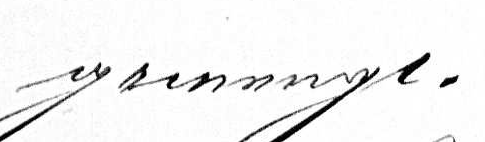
gemengt.
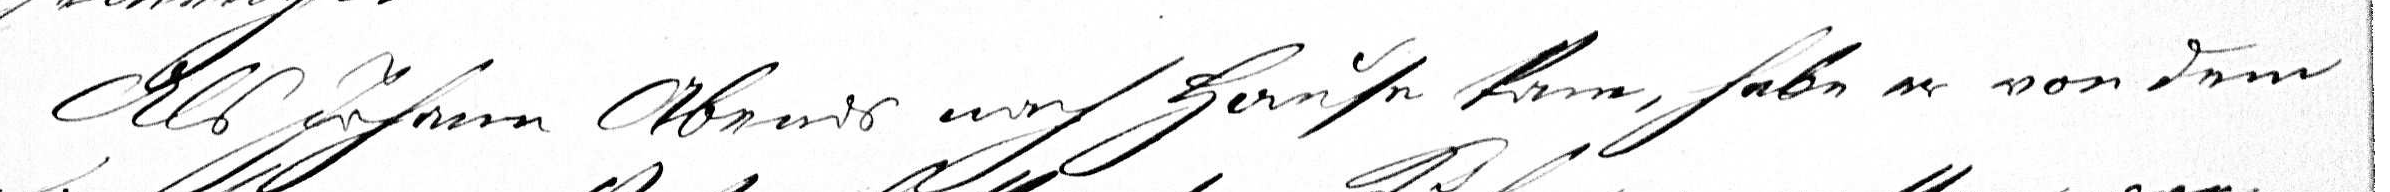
Als Johann Abends nach Hause kam, habe er von dem
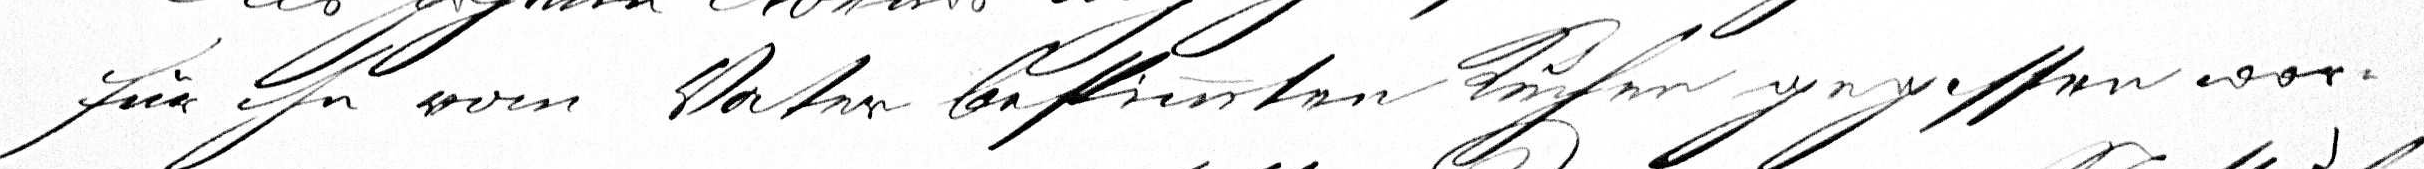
für ihn vom Vater bestimmten Kuchen gegessen wor¬
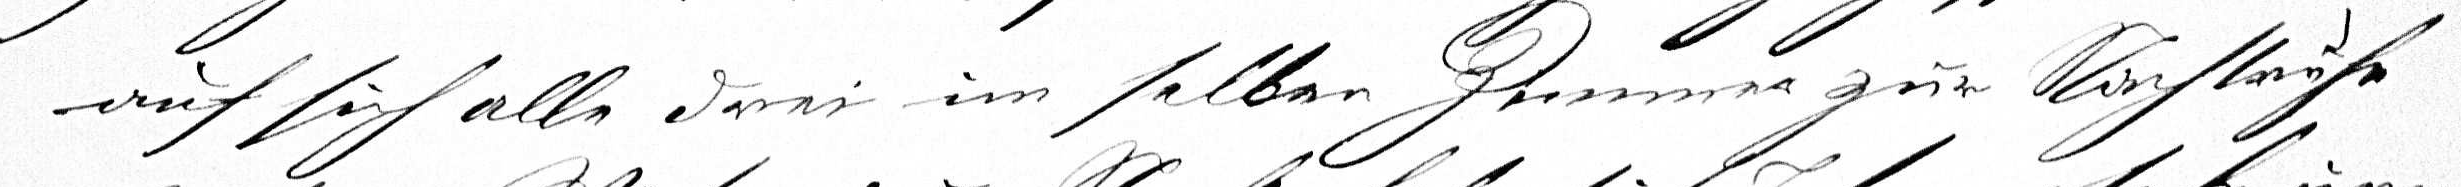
auf sich alle drei im selber Zimmer zur Nachtruhe
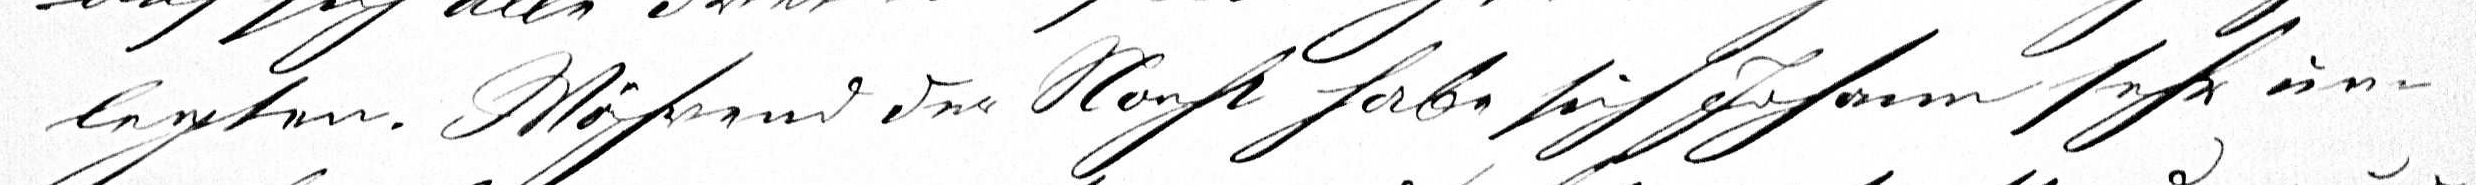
legten. Mährend der Nacht habe sich Johann sehr un¬
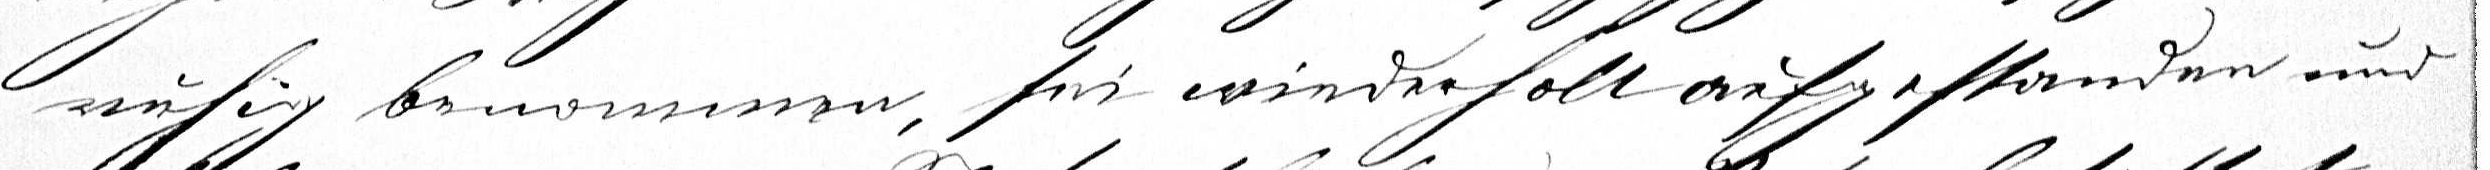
ruhig benommen, sei wiederholt aufgestanden und
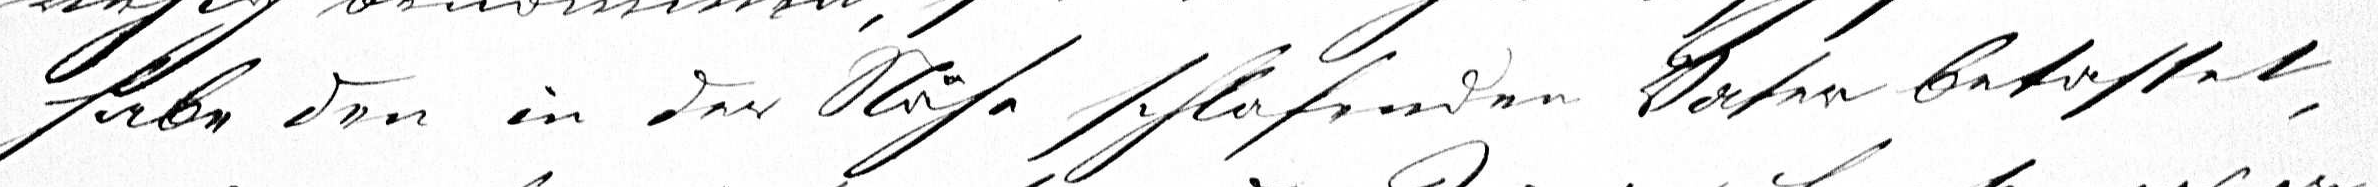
habe den in der Nähe schlafenden Vater betastet,
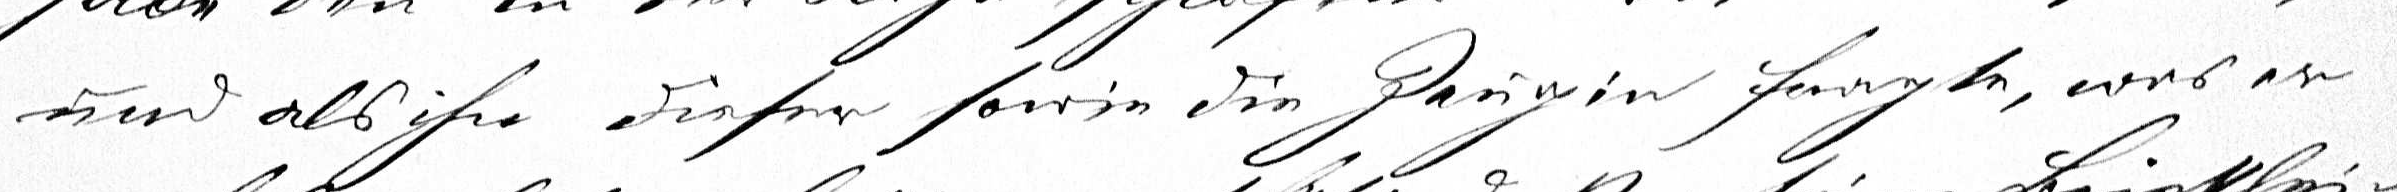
und als ihn dieser sowie die Zeugin fragte, was er
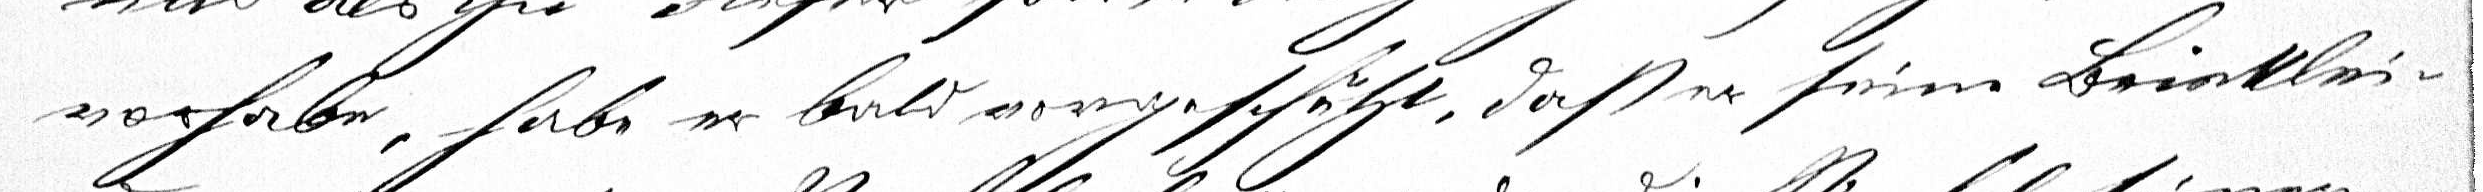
vorhabe, habe er bald vorgeschützt, daß er seine Beinklei¬
